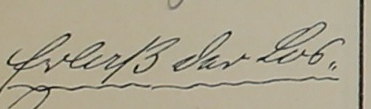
Erlaß der Los-
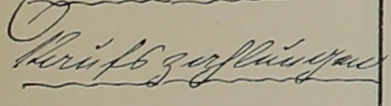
kaufszahlungen
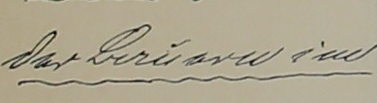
der Bauern im
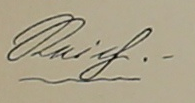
Reich.
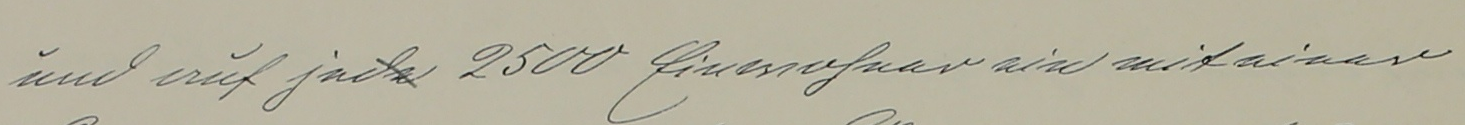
und auf jede 2500 Einwohner ein mit einer
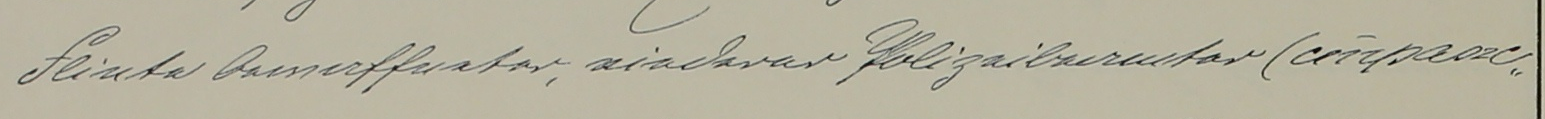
Flinte bewaffneter, niederer Polizeibeamter (страж-
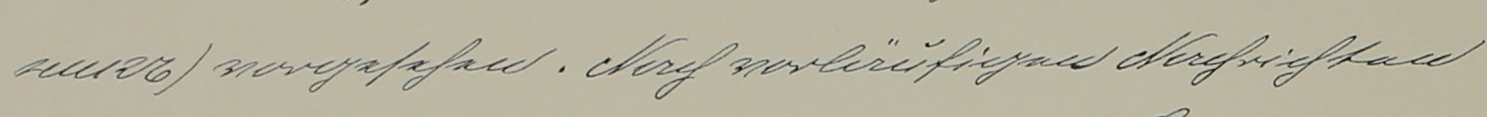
никъ) vorgesehen. Nach vorläufigen Nachrichten
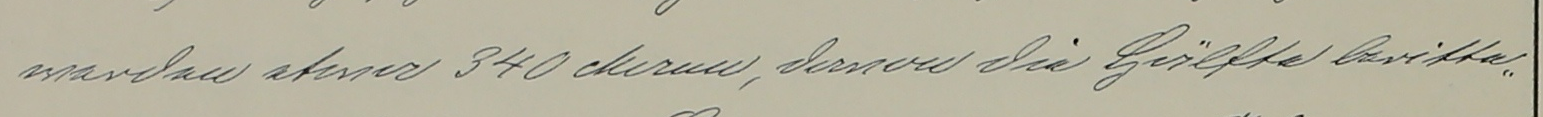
werden etwa 340 Mann, davon die Hälfte beritte-
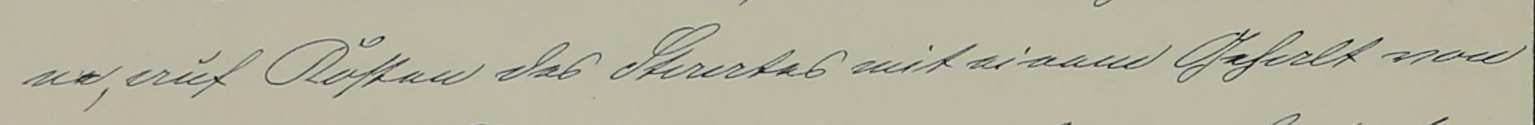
ne, auf Kosten des Staates mit einem Gehalt von
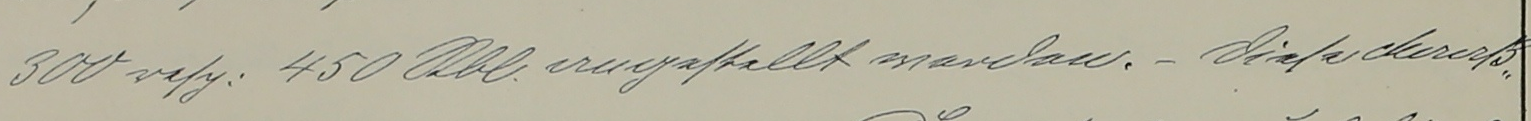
300 resp. 450 Rbl. angestellt werden. - Diese Maaß-
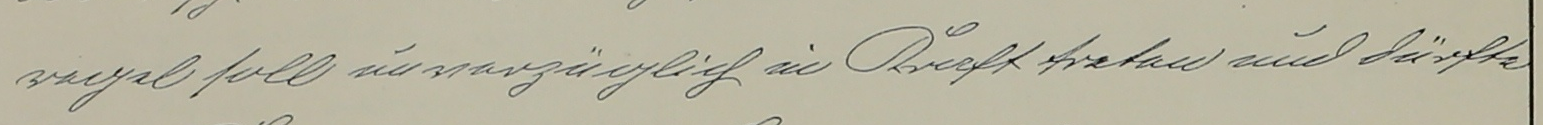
regel soll unverzüglich in Kraft treten und dürfte
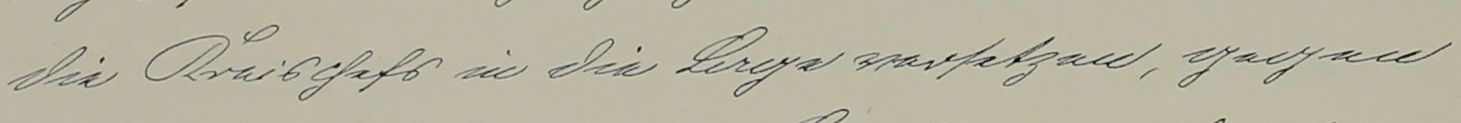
die Kreischefs in die Lage versetzen, gegen
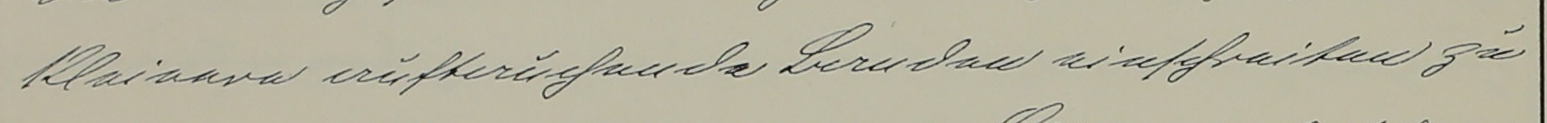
kleinere auftauchende Banden einschreiten zu
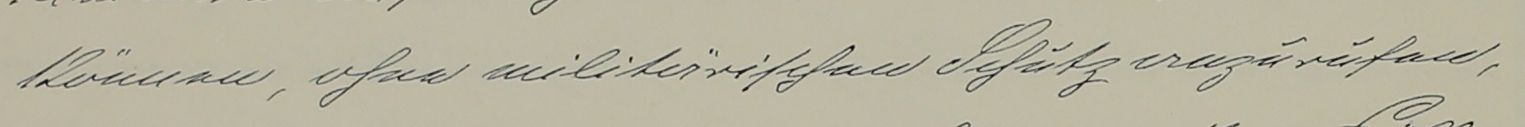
können, ohne militärischen Schutz anzurufen,
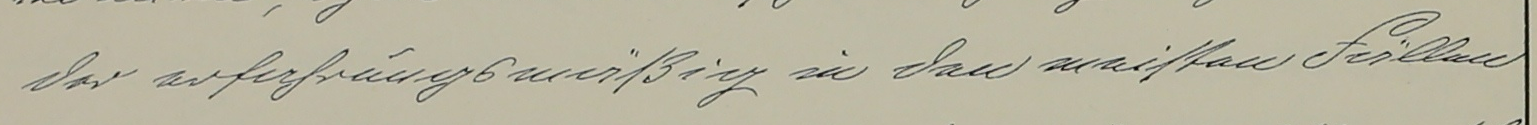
der erfahrungsmäßig in den meisten Fällen
